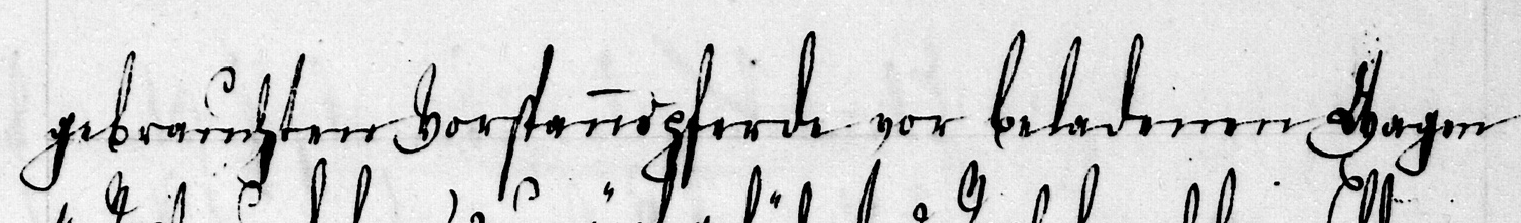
gebrauchten Vorspannspferde vor beladenen Wagen
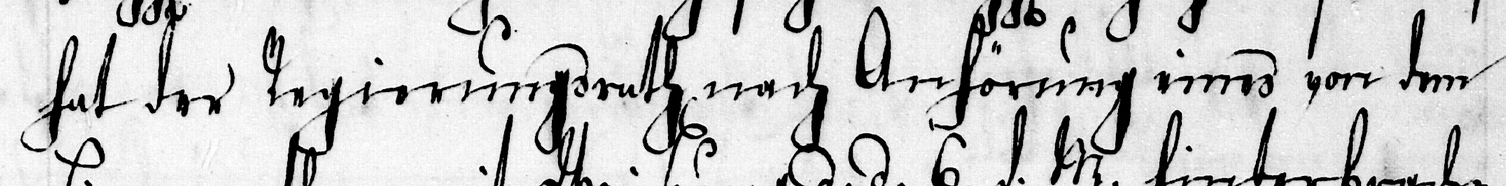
hat der Regierungsrath nach Anhörung eines von dem
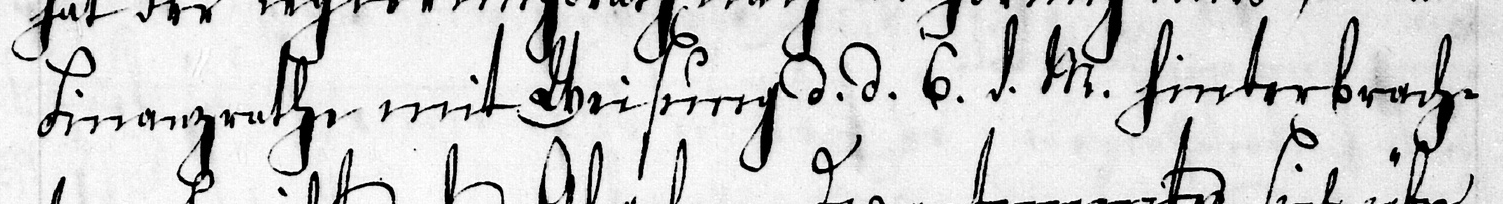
Finanzrathe mit Weisung d. d. 6. d. M. hinterbrach¬
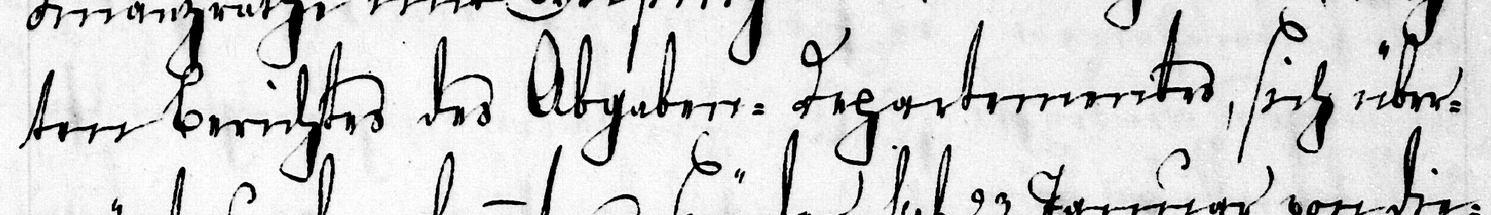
ten Berichtes des Abgaben-Departementes, sich über¬
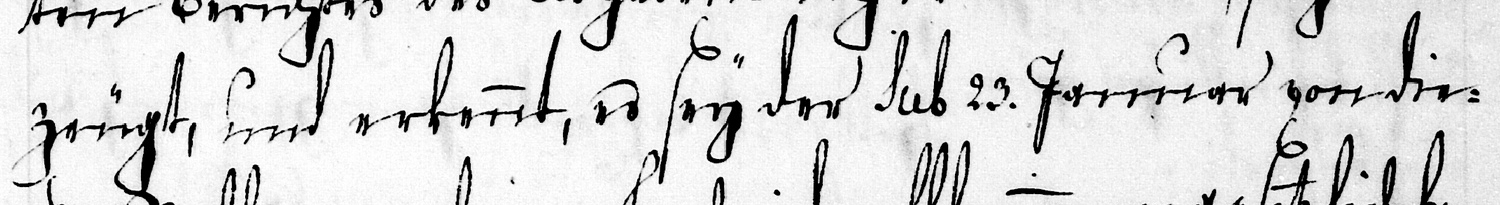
zeugt, und erkennt, es sey der sub 23. Januar von die¬
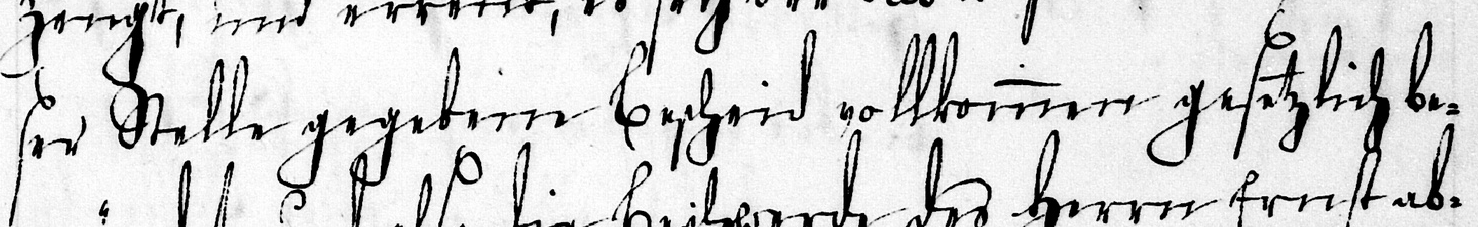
ser Stelle gegebene Bescheid vollkommen gesetzlich b¬
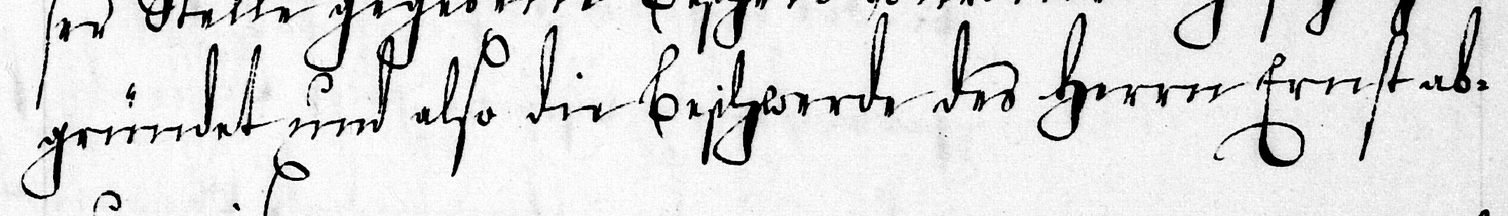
egründet und also die Beschwerde des Herrn Ernst ab¬
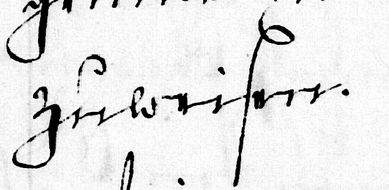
zuweisen.
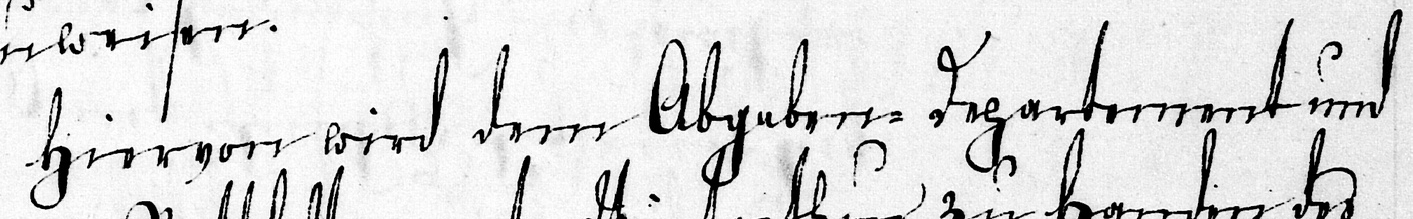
Hiervon wird dem Abgaben-Departement und
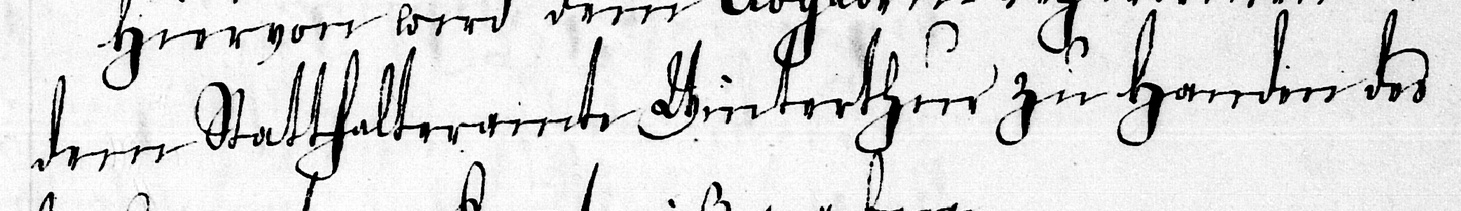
dem Statthalteramte Winterthur zu Handen des
